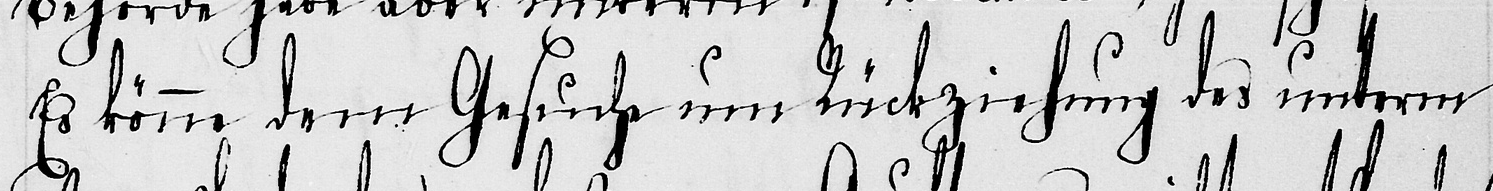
Es könne dem Gesuche um Rückziehung des unterm
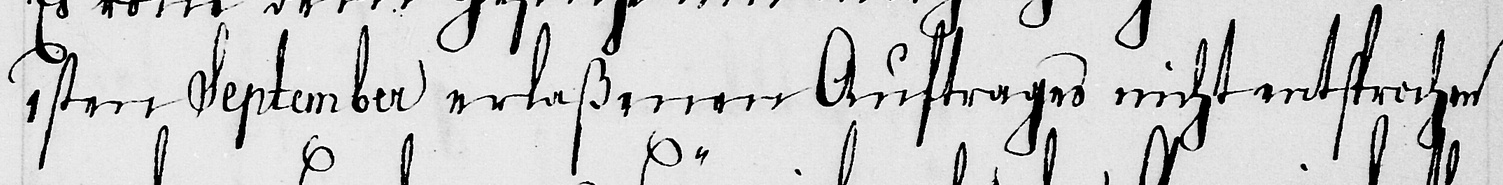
1sten September erlaßenen Auftrages nicht entsprochen
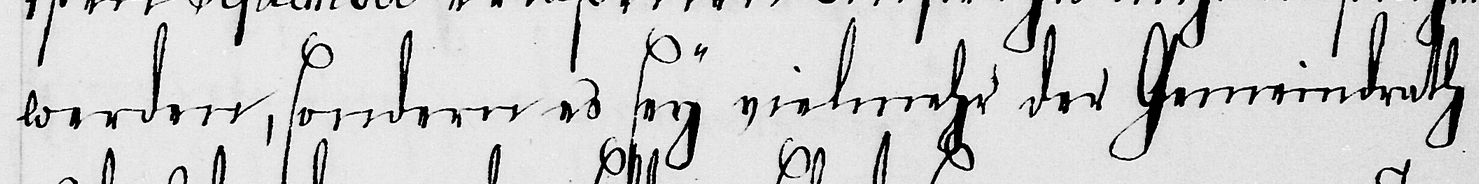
werden, sondern es sey vielmehr der Gemeindrath
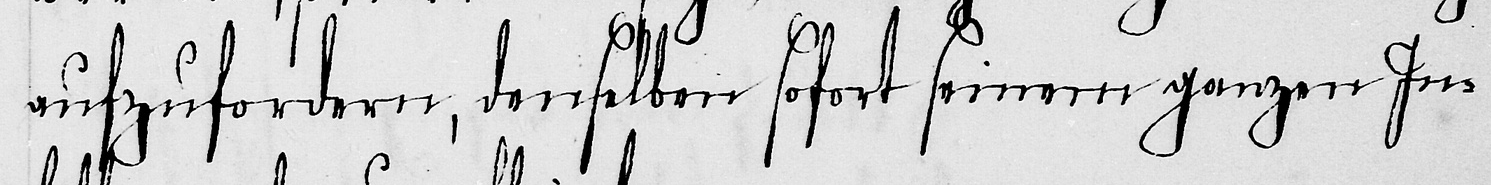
aufzufordern, denselben sofort seinem ganzen In¬
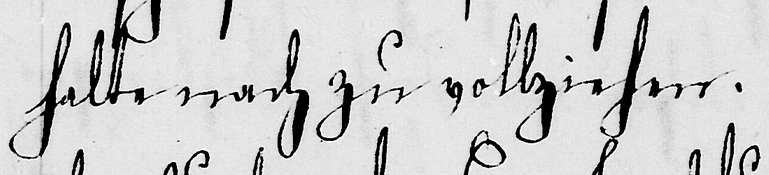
halte nach zu vollziehen.
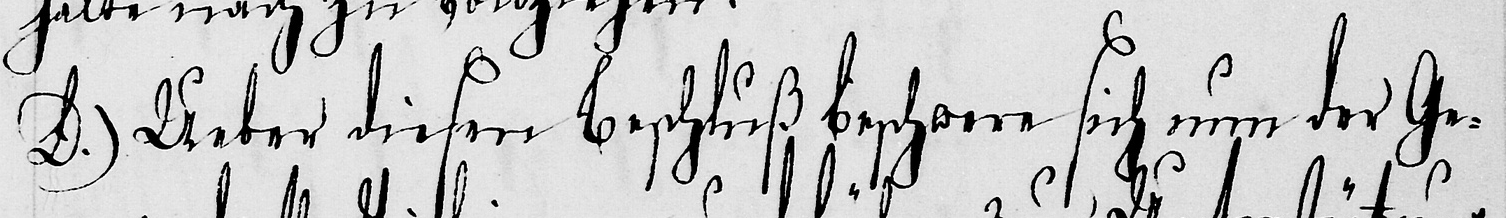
D.) Ueber diesen Beschluß beschwere sich nun der Ge¬
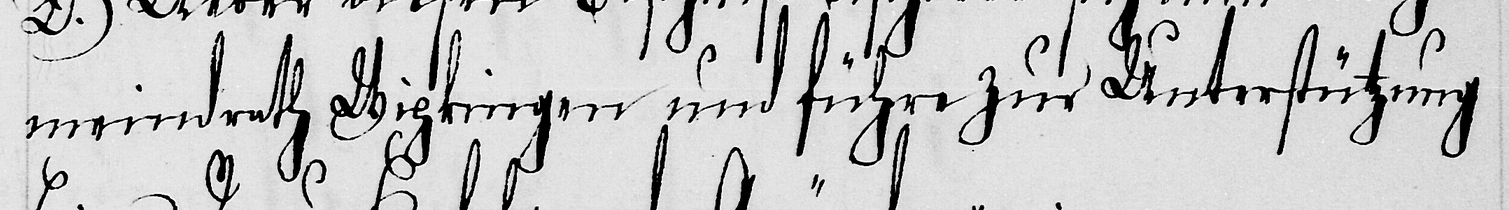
meindrath Wipkingen und führe zur Unterstützung
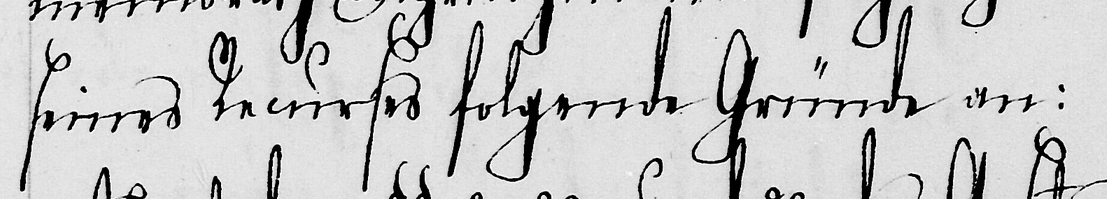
seines Recurses folgende Gründe an:
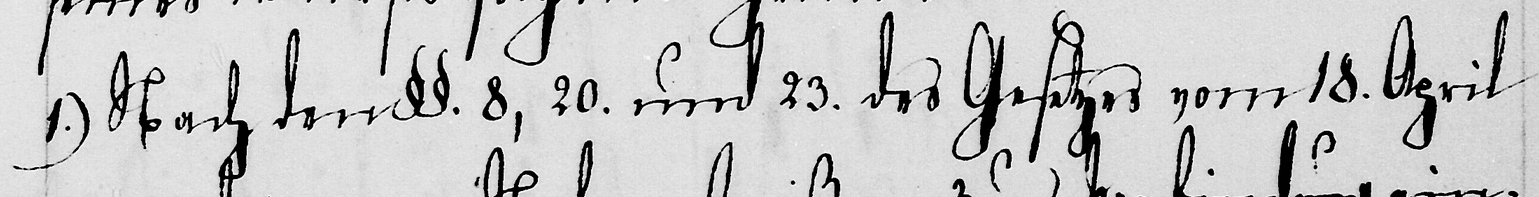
1.) Nach den §§. 8, 20. und 23. des Gesetzes vom 18. April
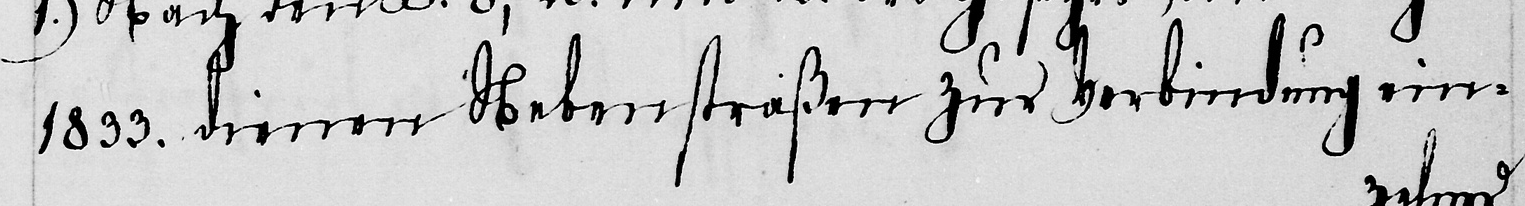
1833. dienen Nebenstraßen zur Verbindung ein-
